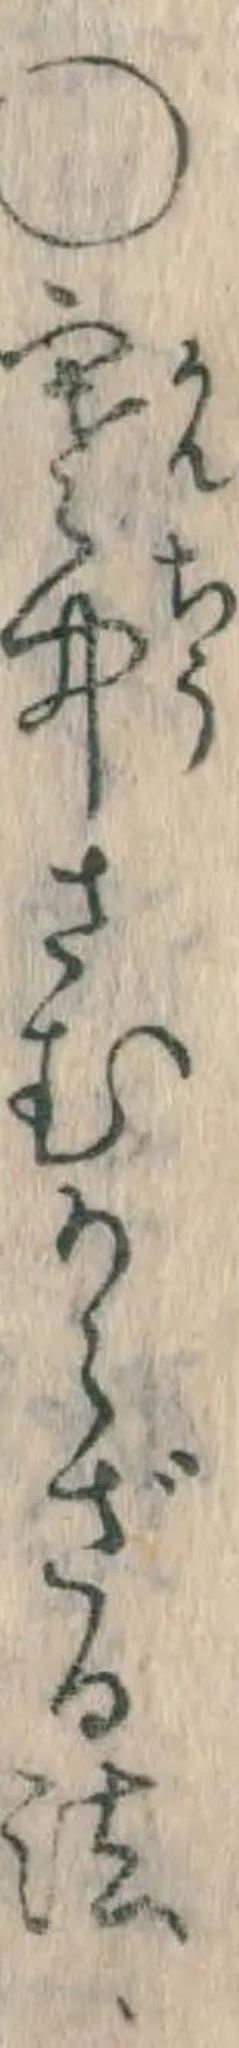○寒中さむからざる法
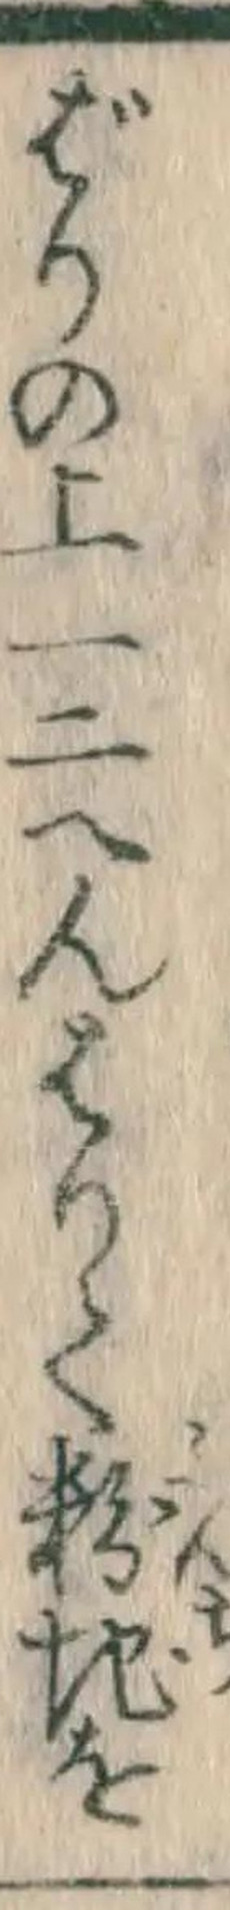ばりの上一二へんはりて粉地を
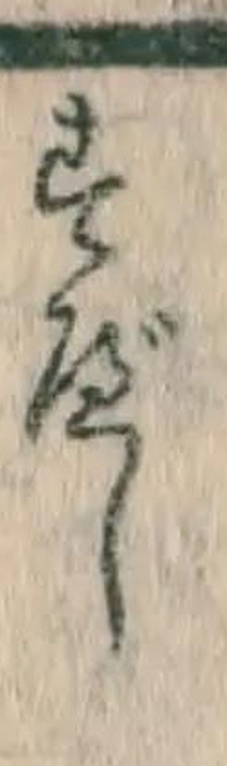すべし

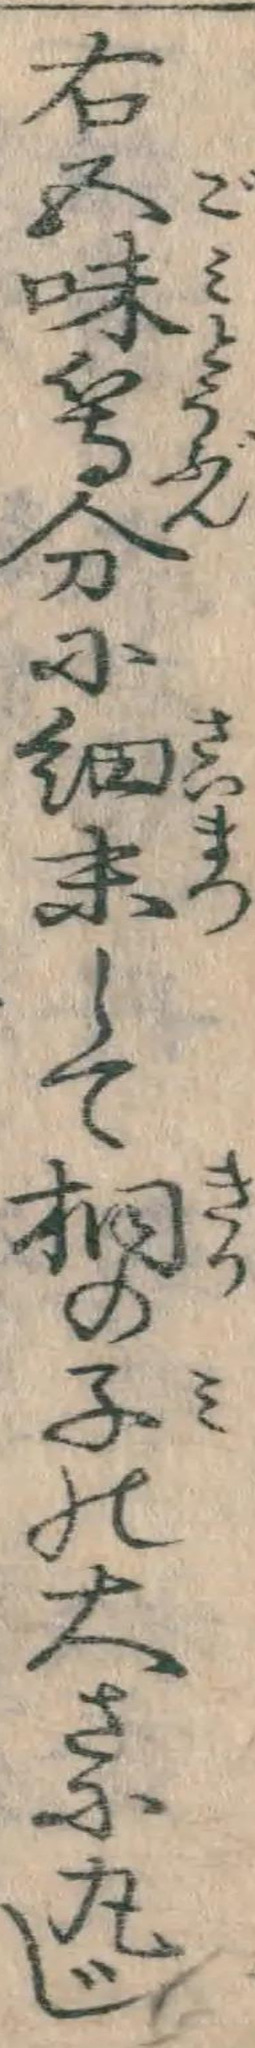右五味等分に細末して桐の子の大さに丸じ
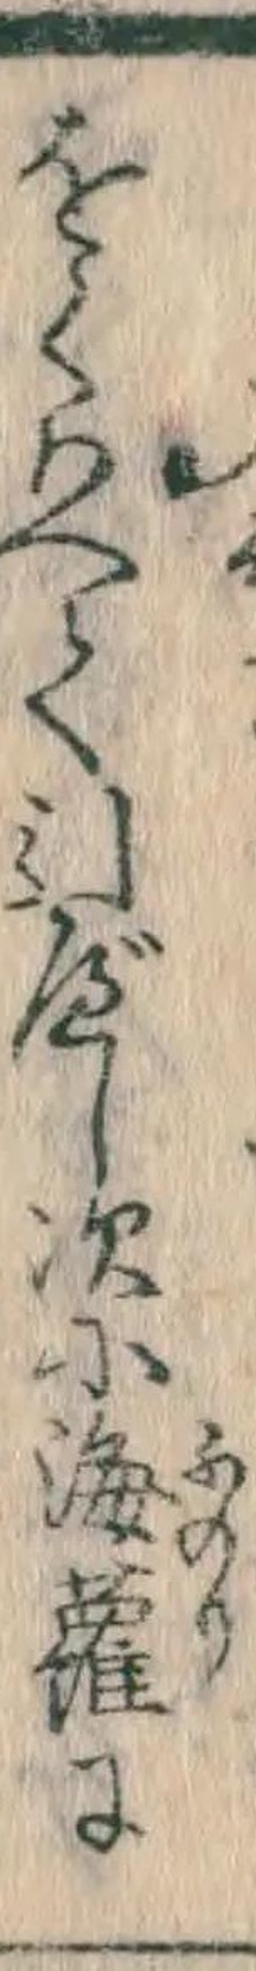をくはへて引べし次に海蘿に
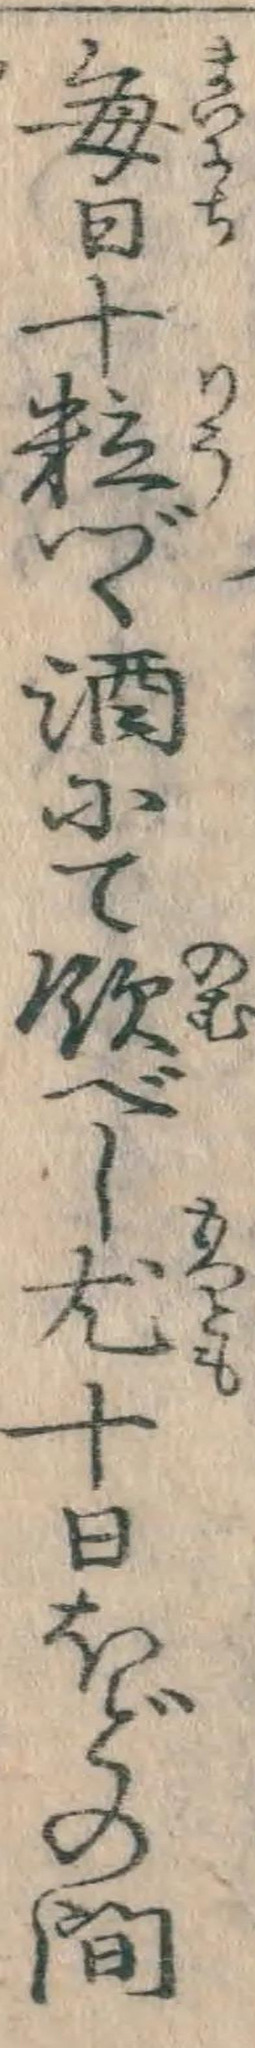毎日十粒ヅヽ酒にて飲べし尤十日ほどの間
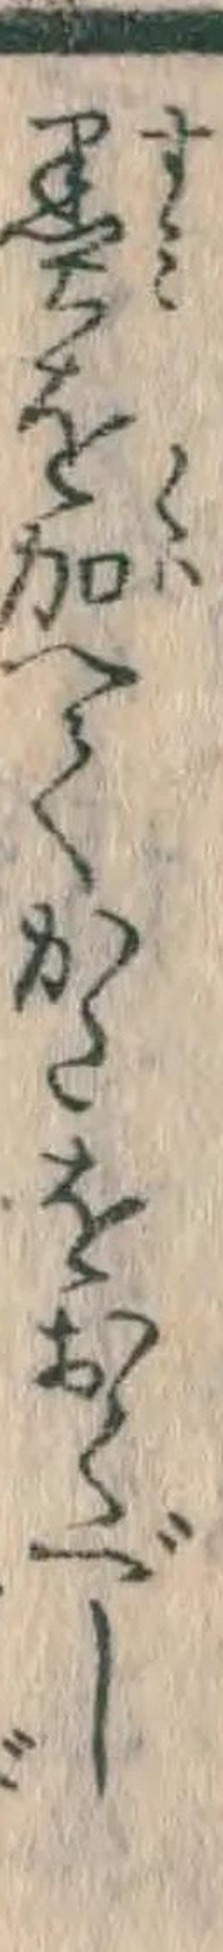墨を加へてかたをおくべし
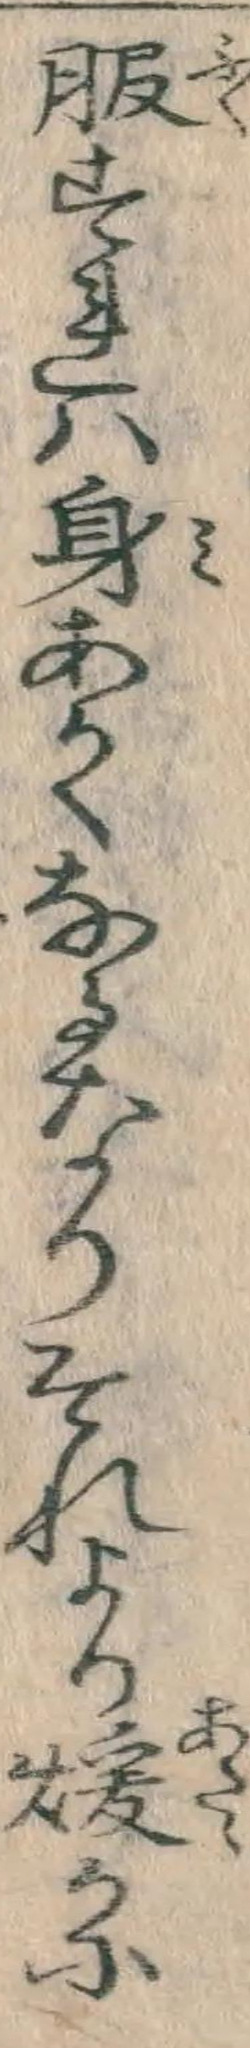服すれは身あかくなるなりそれより煖かに
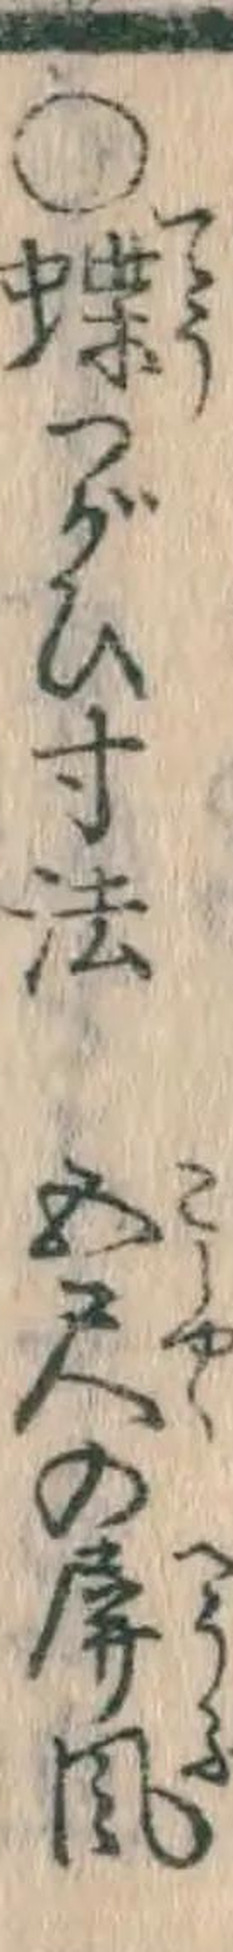○蝶つがひ寸法五尺の屏風
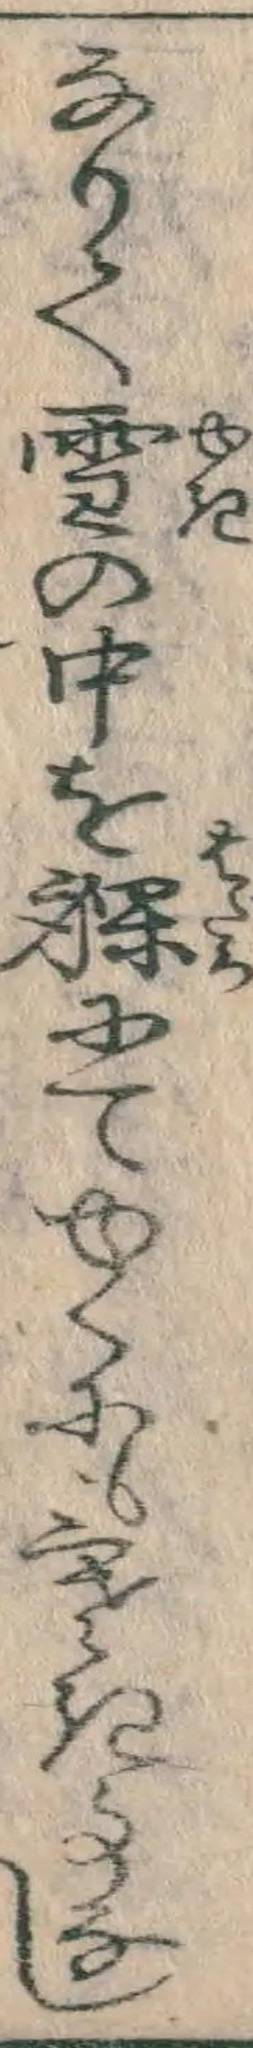なりて雪の中を裸にてゆくにも寒き事なし
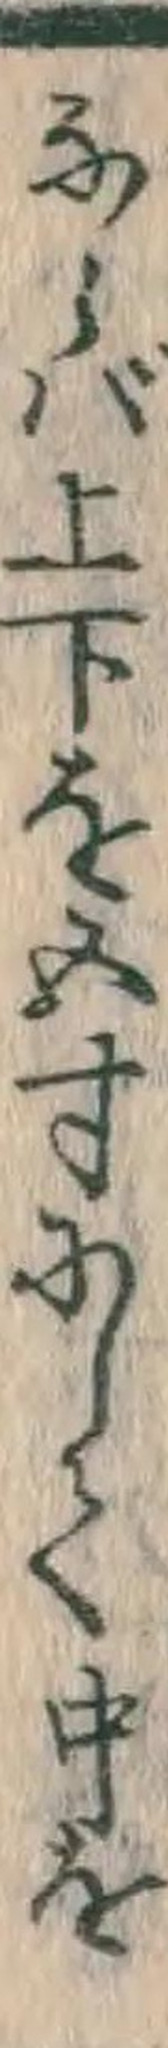ならば上下を五寸にして中を
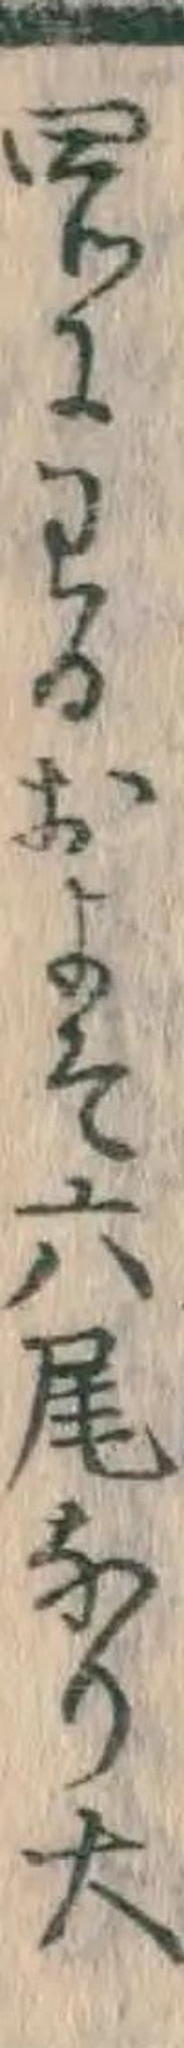四ッにわるおよそ六尾なり大
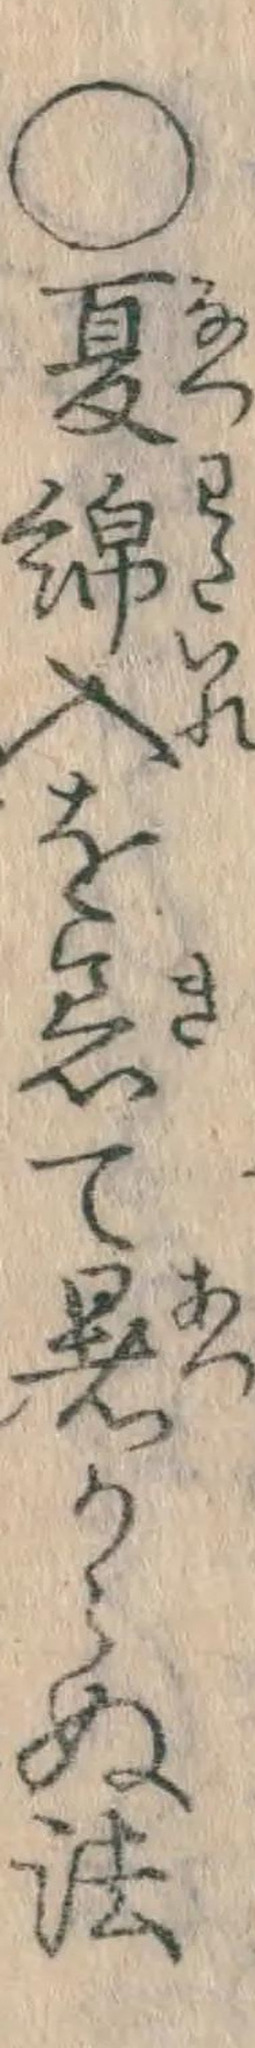○夏綿入を着て暑からぬ法
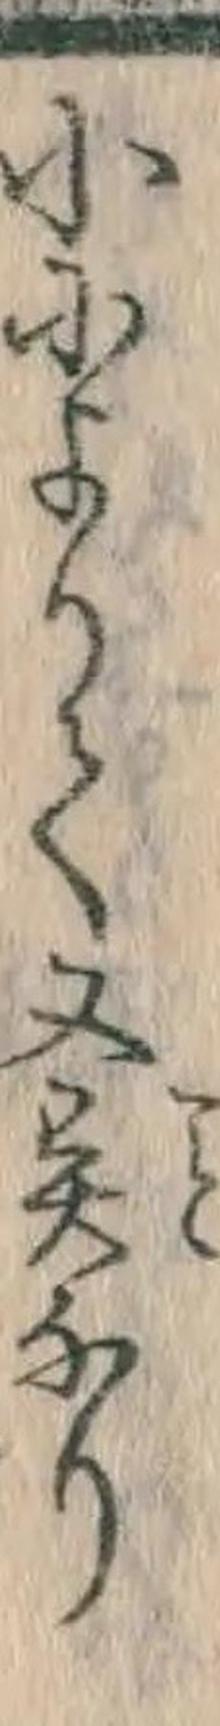小によりて又異なり
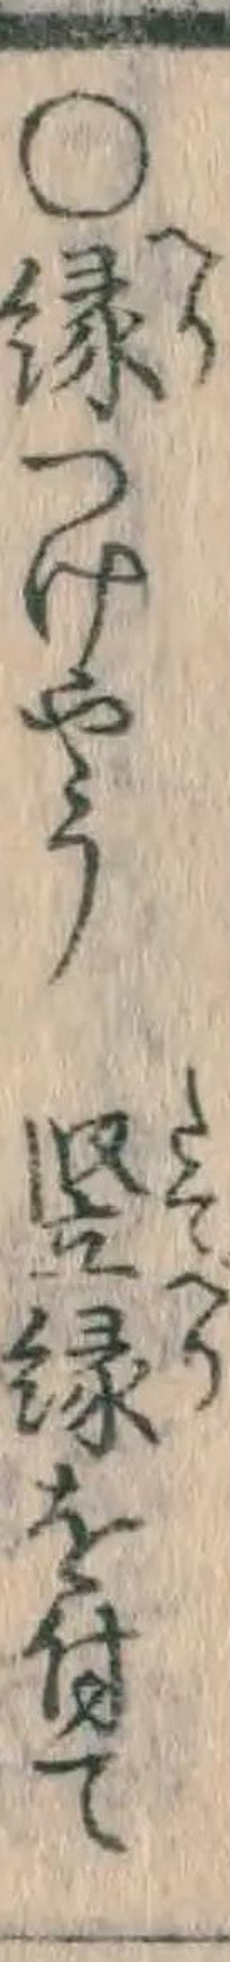○縁つけやう竪縁を付て
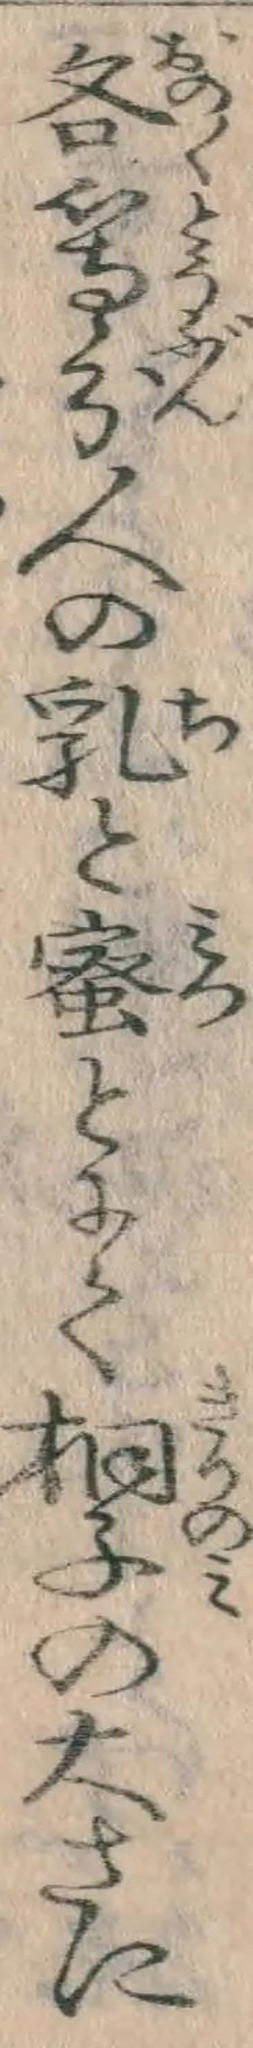各等分人の乳と蜜とにて桐子の大さに
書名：広益秘事大全 3巻. [2]
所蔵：国立国会図書館 National Diet Library, JAPAN
